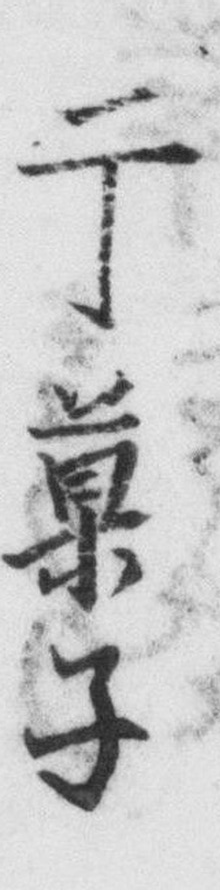干菓子
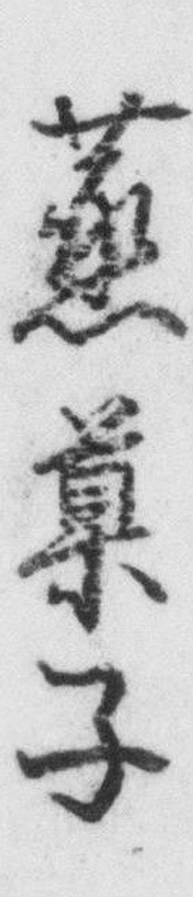蒸菓子
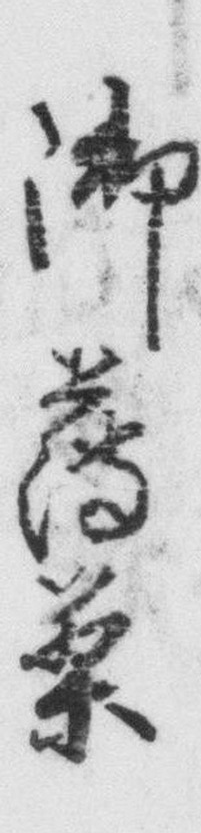御薄茶
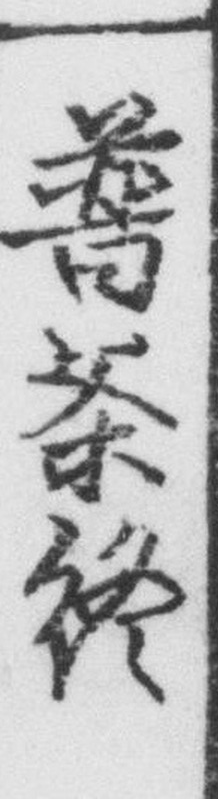普茶終

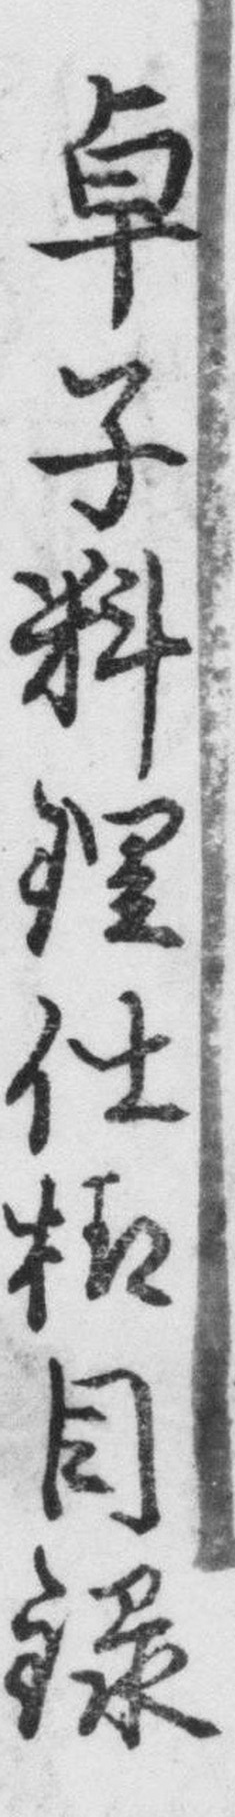卓子料理仕様目録
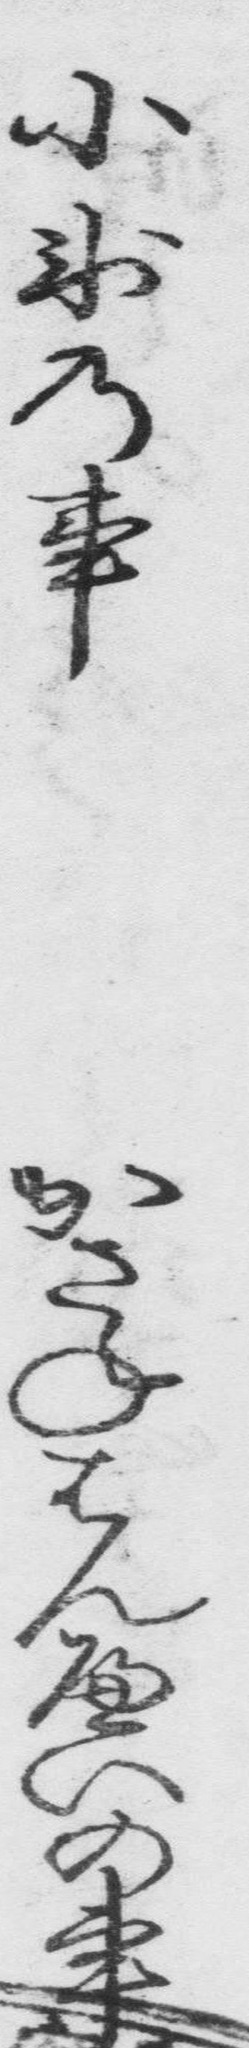小氷乃事かさ年はん扁いの事

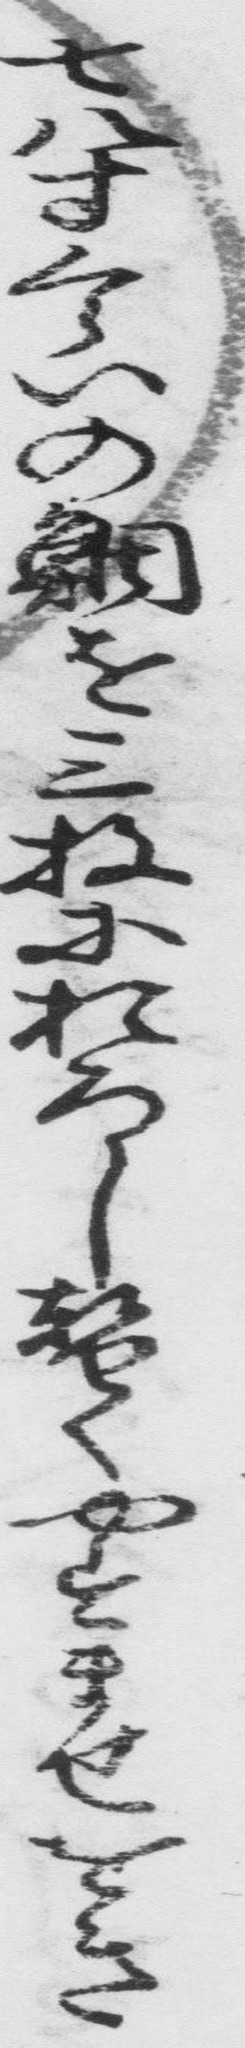七八寸くらいの鯛を三枚尓於ろし暫くや春ませをき
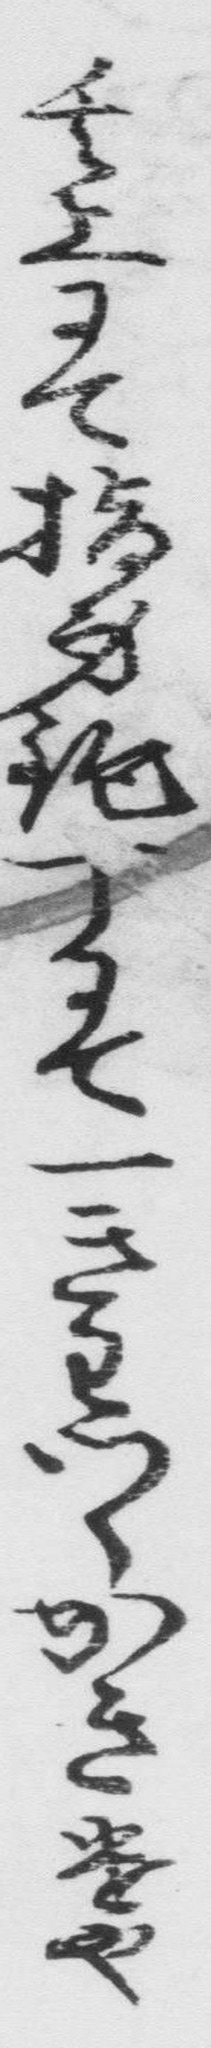其上尓て指身鉋丁尓て一きわツゝかき遣也
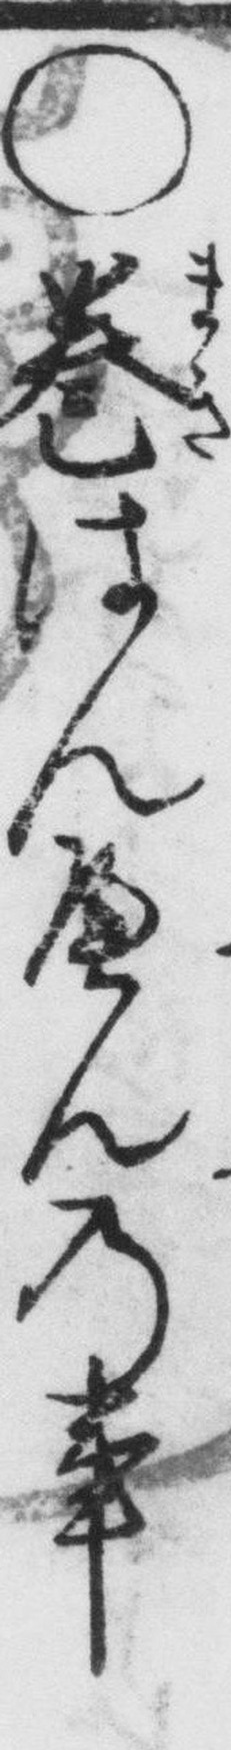〇巻はん扁ん乃事
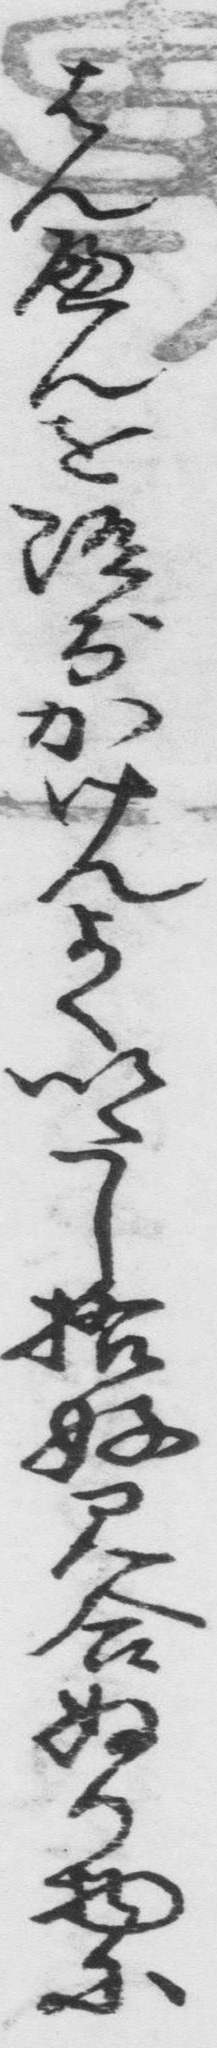はん扁んを随分かけんよく以たし格好見合ぬり物尓
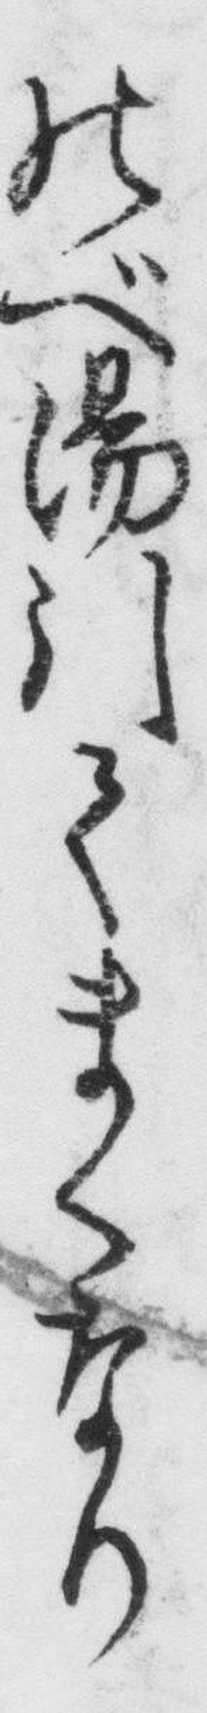能べ湯引てまくなり
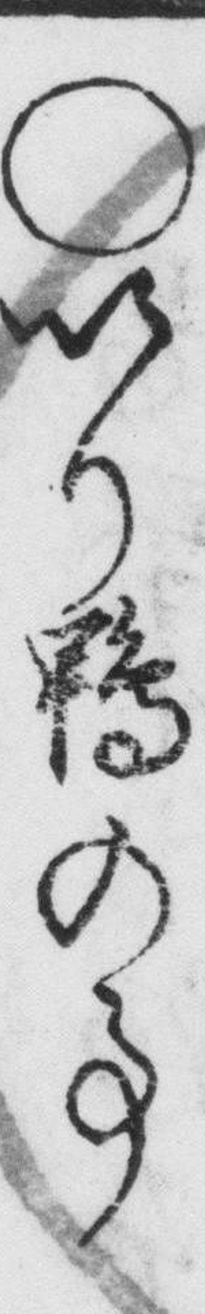〇以り鴨の事
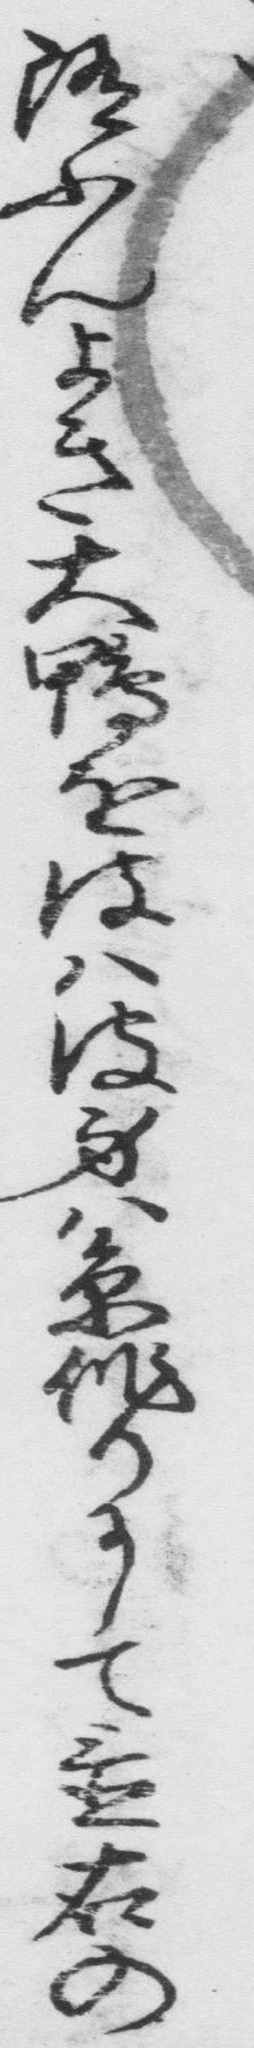随ふんよき大鴨を皮は皮身は糸作り尓して置右の
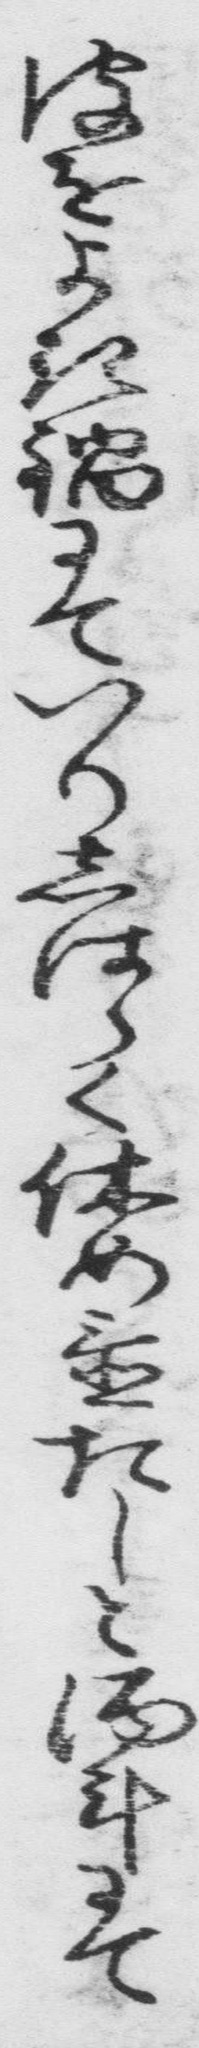皮をよ起鍋尓ていり志はらく休め置たしと酒斗尓て

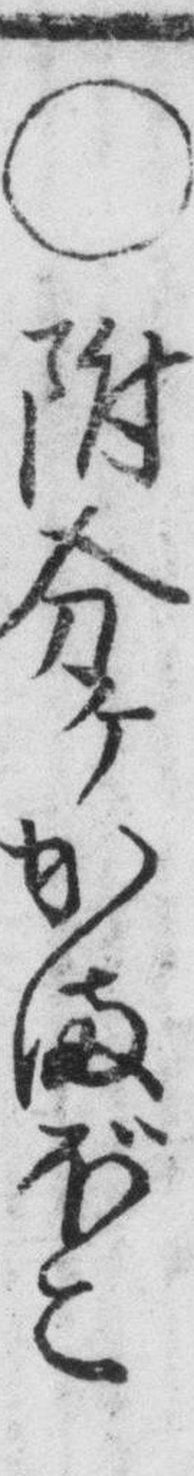〇附分ケか満ぼこ
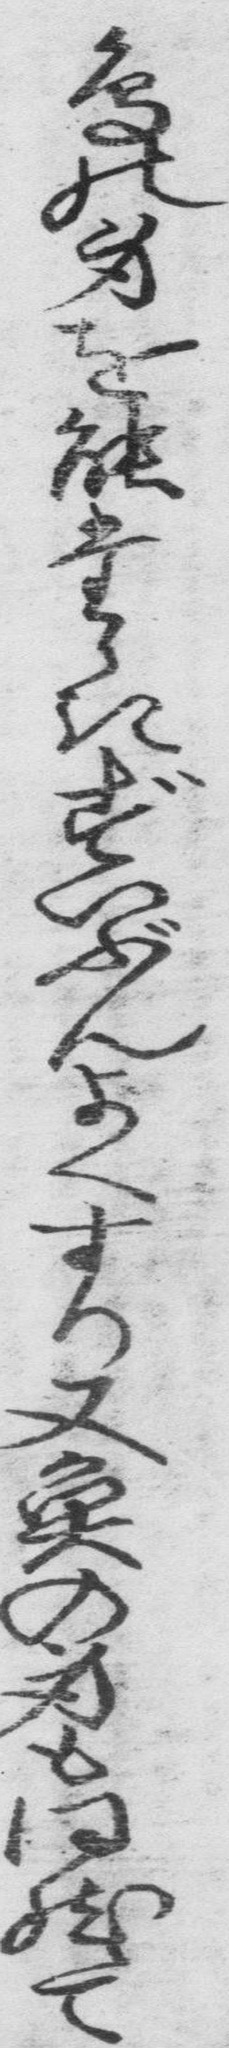鳥能身を能堂ら起ずいぶんよくすり又魚の身も同然て
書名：普茶料理抄
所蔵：大阪府立大学学術情報センター 国文学研究資料館
